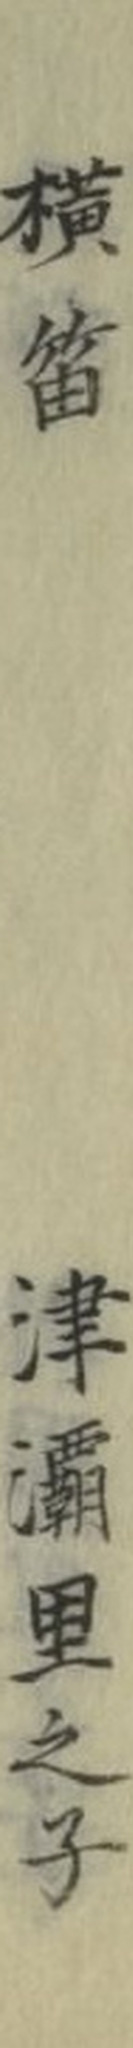横笛津灞里之子
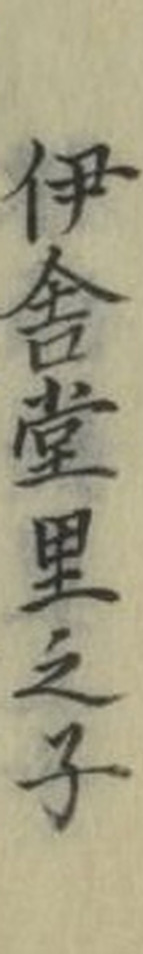管伊舎堂里之子

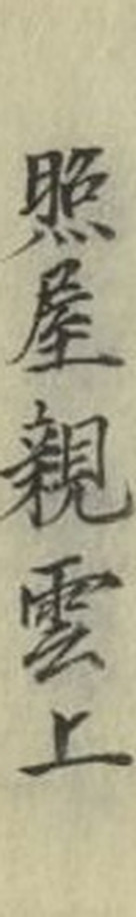吶照屋親雲上
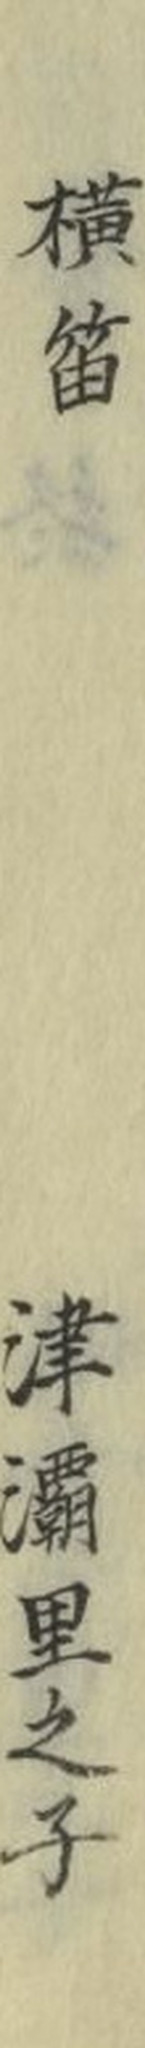横笛津灞里之子
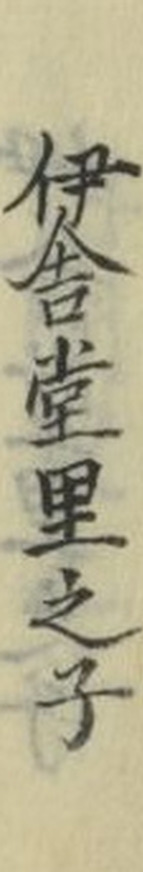菅伊舎堂里之子
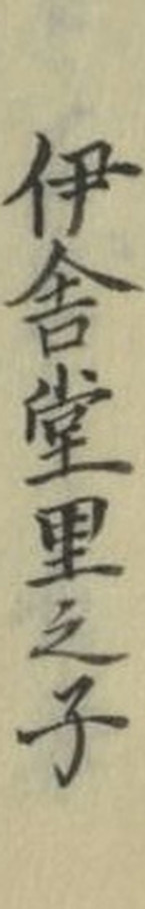菅伊舎堂里之子

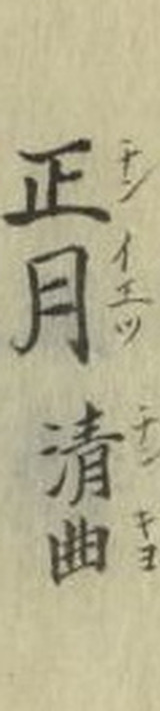正月清曲
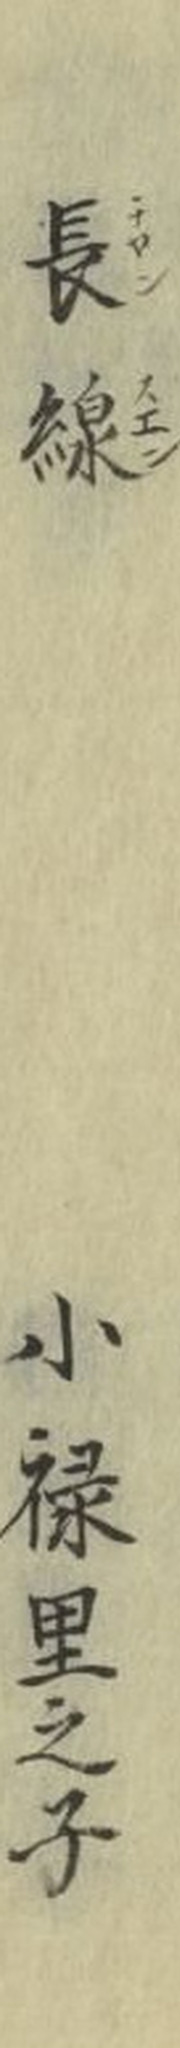長線小禄里之子
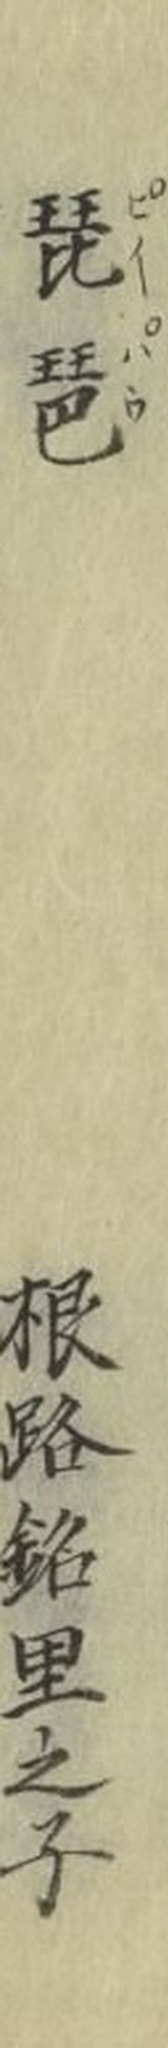琵琶根路銘里之子
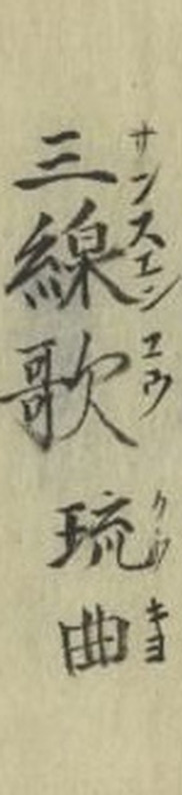三線歌琉曲
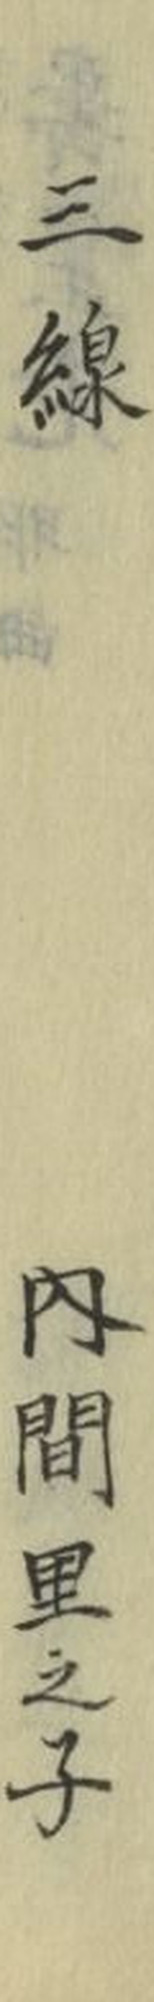三線内間里之子
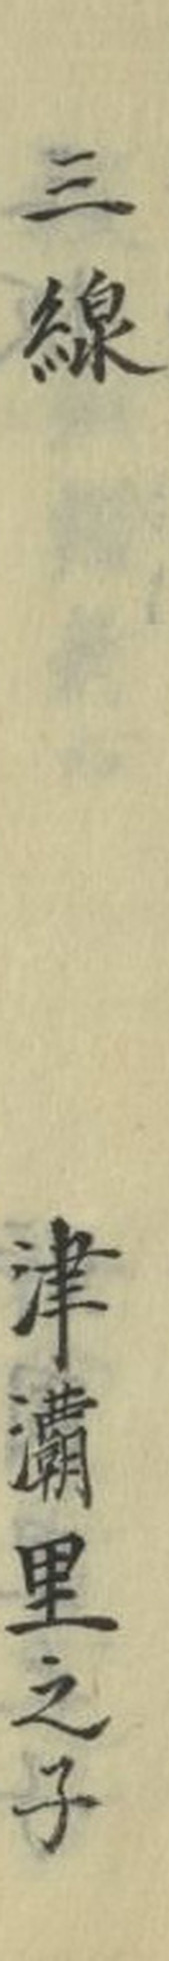三線津灞里之子

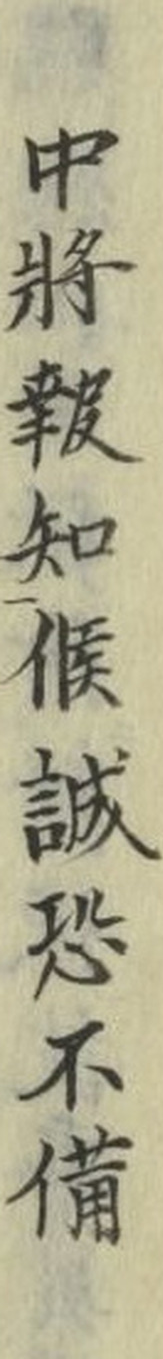中将報知候誠恐不備
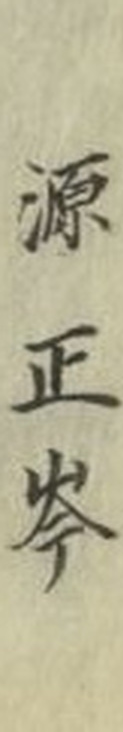源正岑
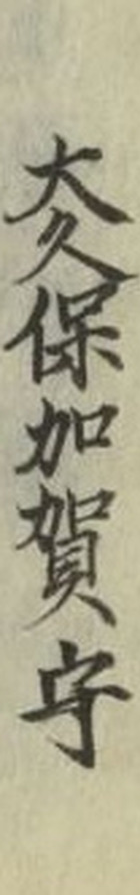大久保加賀守
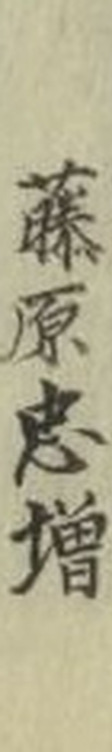藤原忠増
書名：琉球人参府記
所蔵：University of the Ryukyus Library
